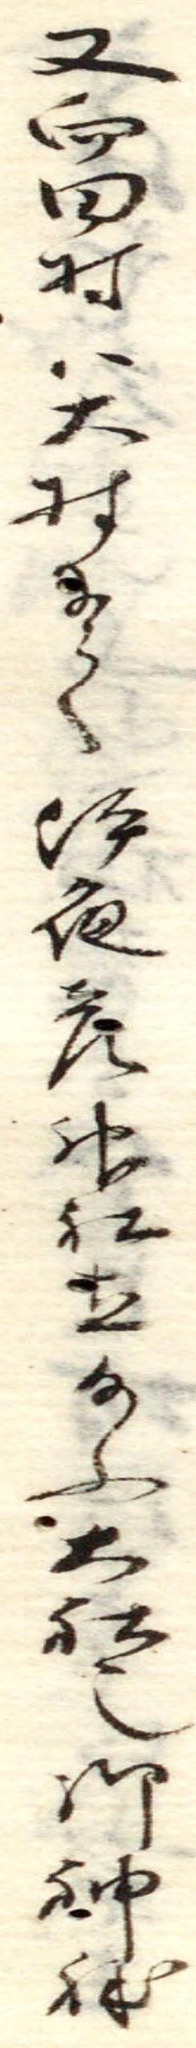又向田村は大村にて伊夜彦神社立給ふ大社也御神躰
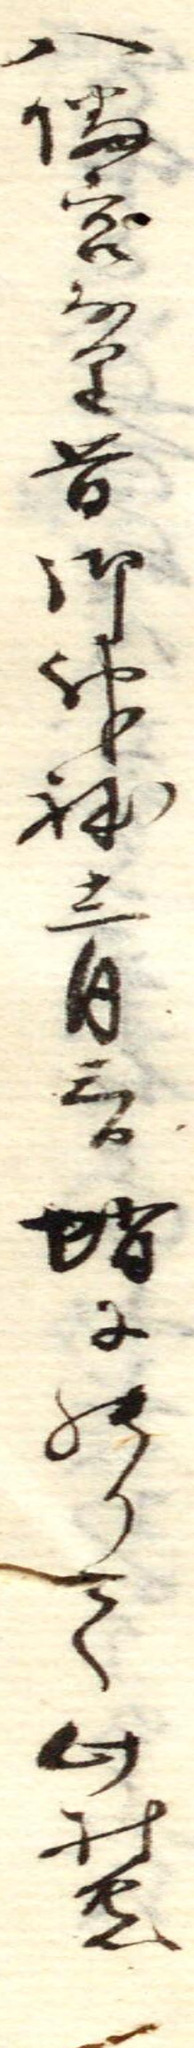八幡宮なり昔御神躰十二月三日蛸にのりて此村の

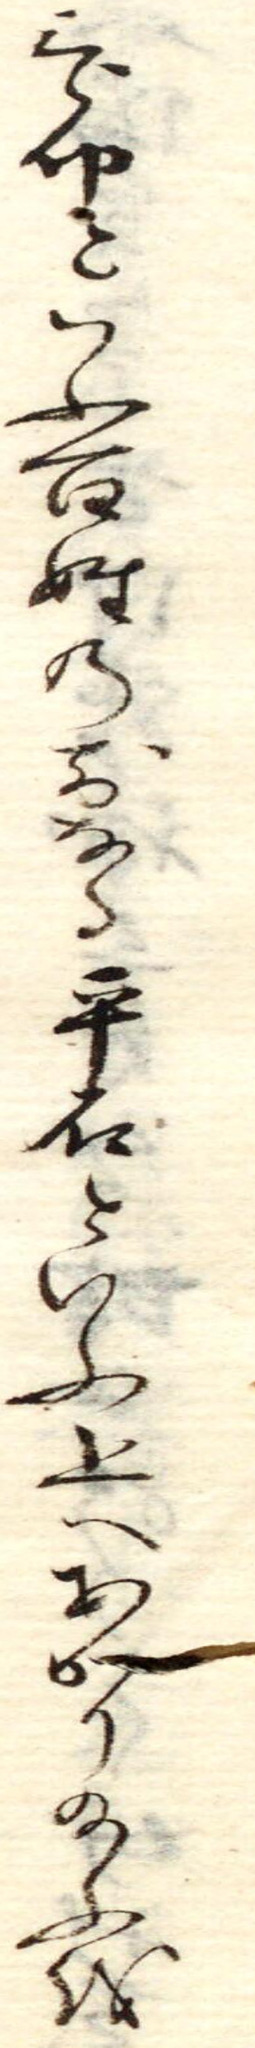三郎助といふ百姓の前なる平石といふ上へあかり給ふを
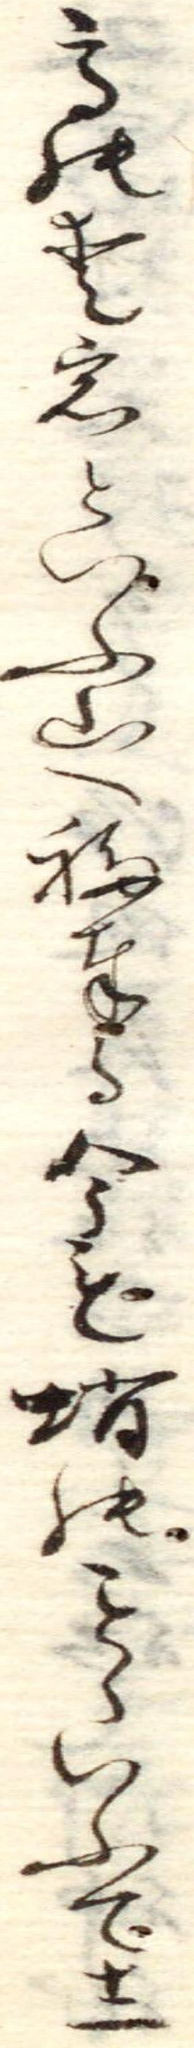馬の愛宕といふ山へ移奉る今も蛸のことくいふて十二
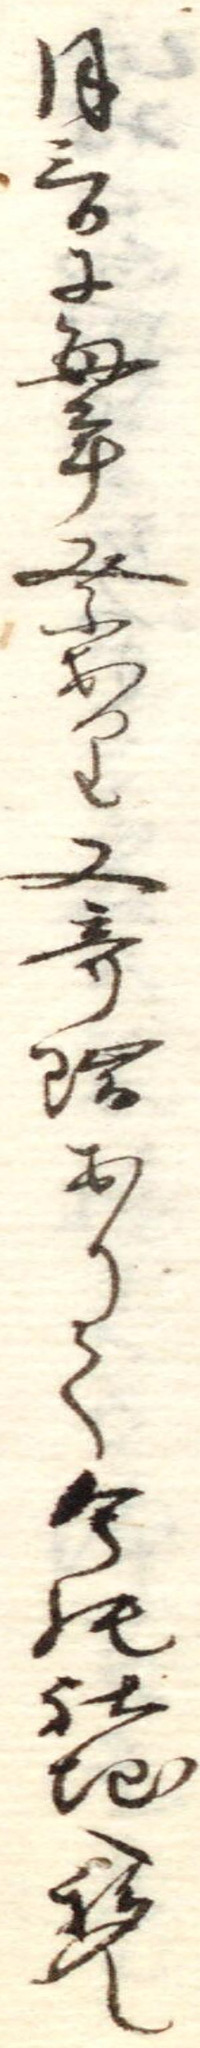月三日に毎年祭あり又奇瑞ありて今の社地へ移し
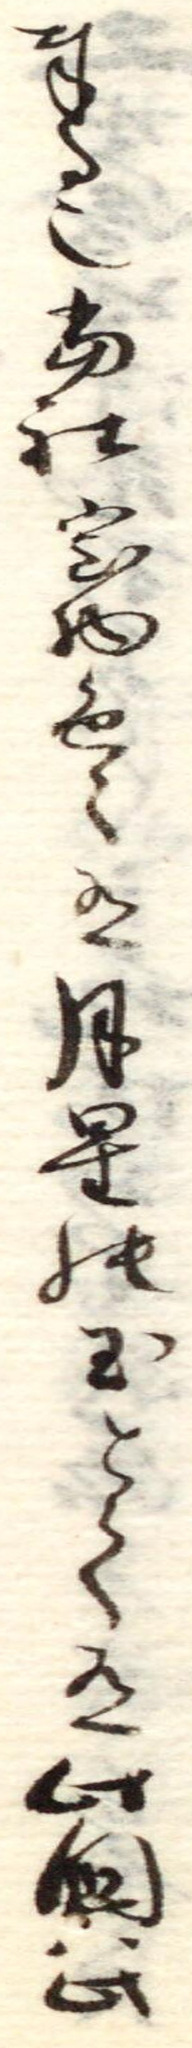奉る也当社宝色々有月星の国とて有此国は此
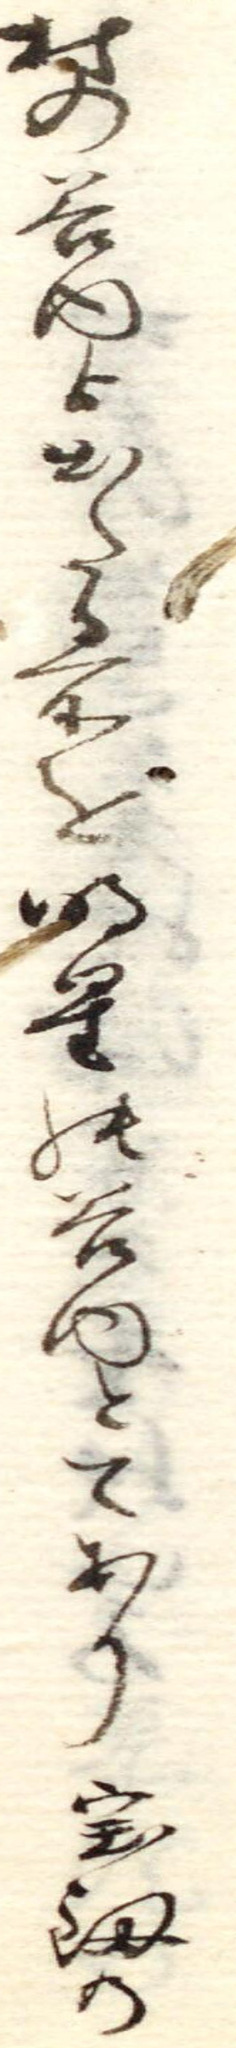村の谷内ゟ出たる所を明星の谷内とてあり宝釼の
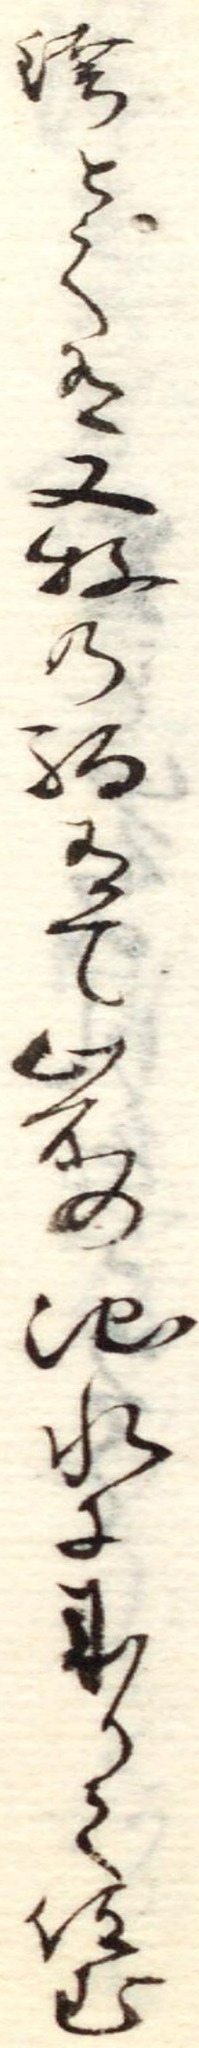銙とて有又牧の駒有て此所の池水に来りて住む
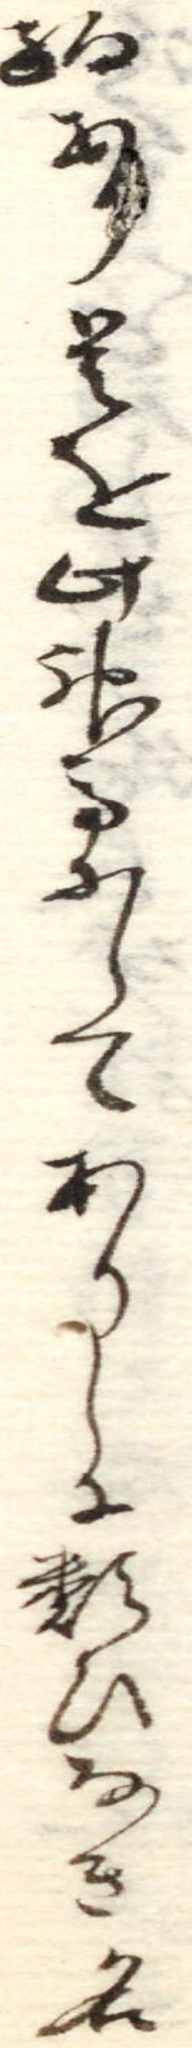駒あり是を此神馬にしてありしに類ひなき名
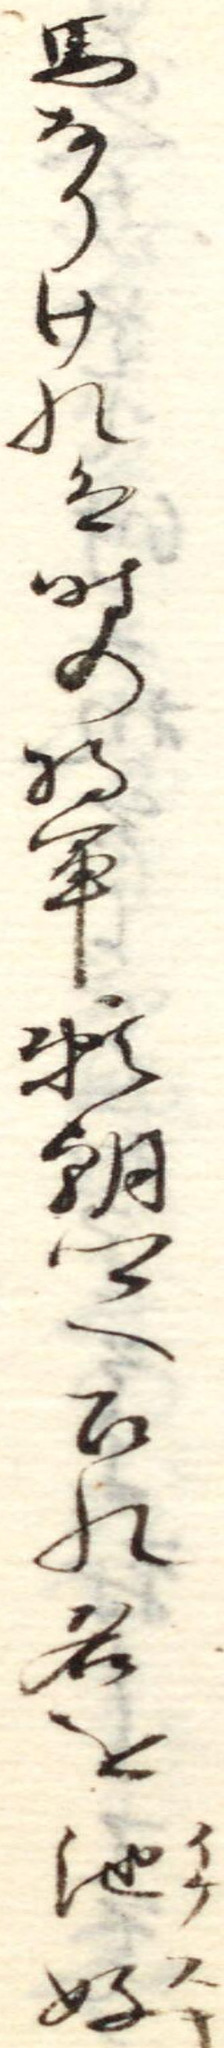馬ありけれは時の将軍頼朝卿へ召れ名を池好
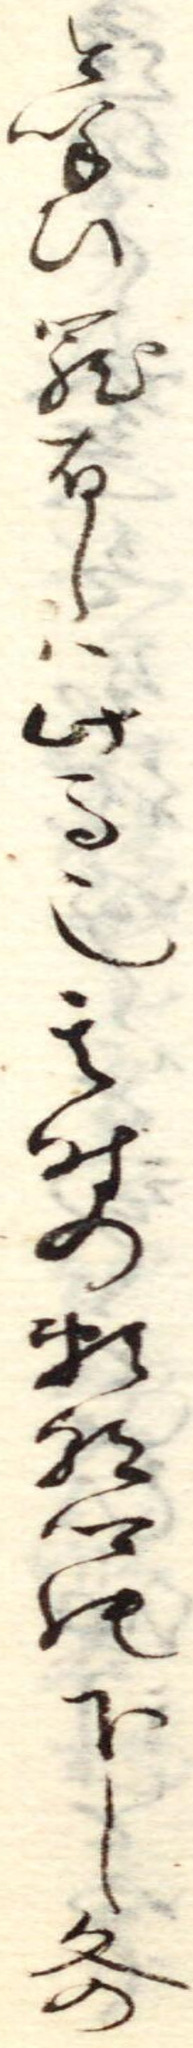と呼ひ蔵有しは此馬也其時の頼朝卿の下し文の
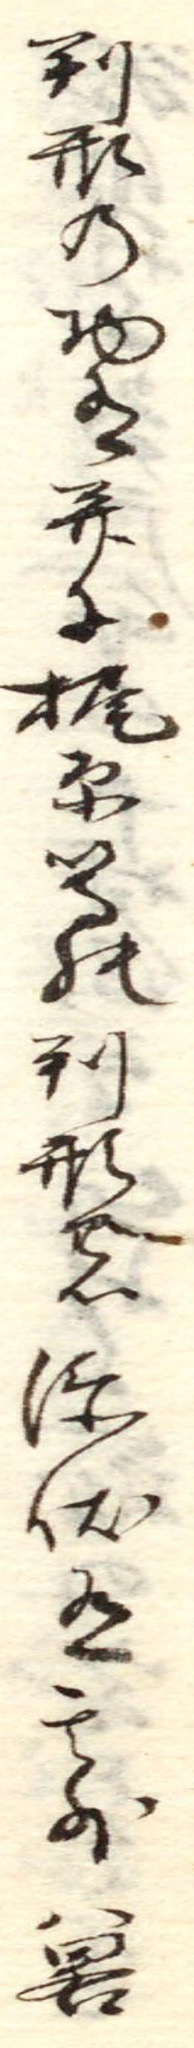判形の物有并に梶原等の判形の添状有其外略
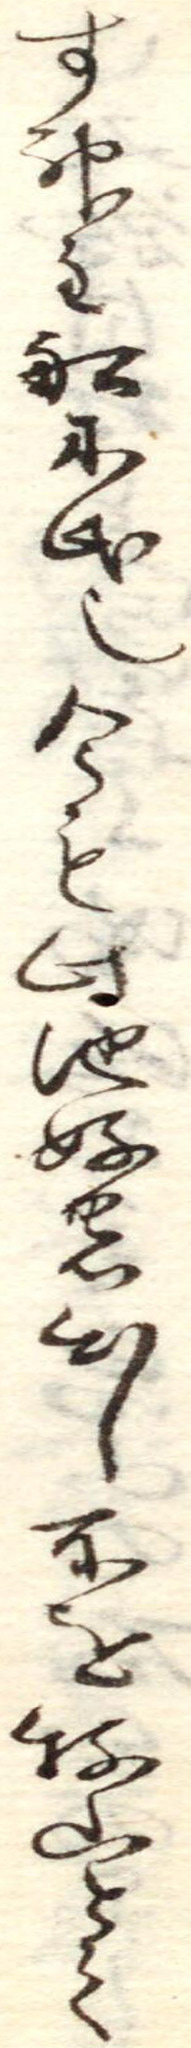す神主船木氏也今も此池好の出し所を牧山とて
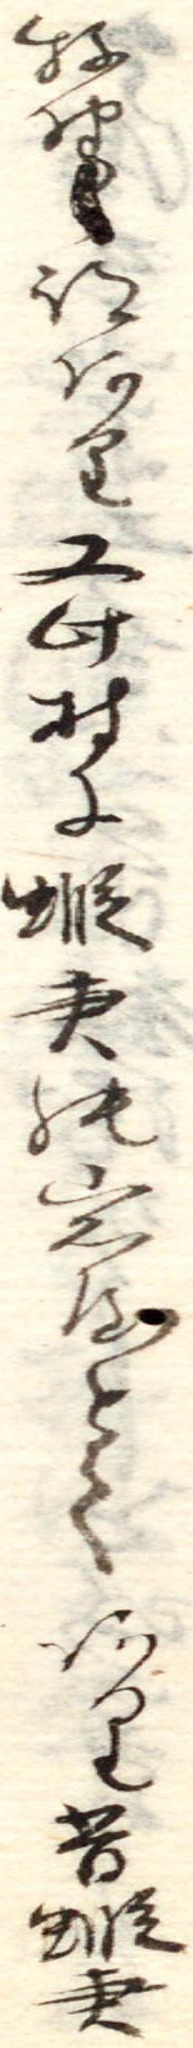牧野之跡あり又此村に蝦夷の岩屋とてあり昔蝦夷
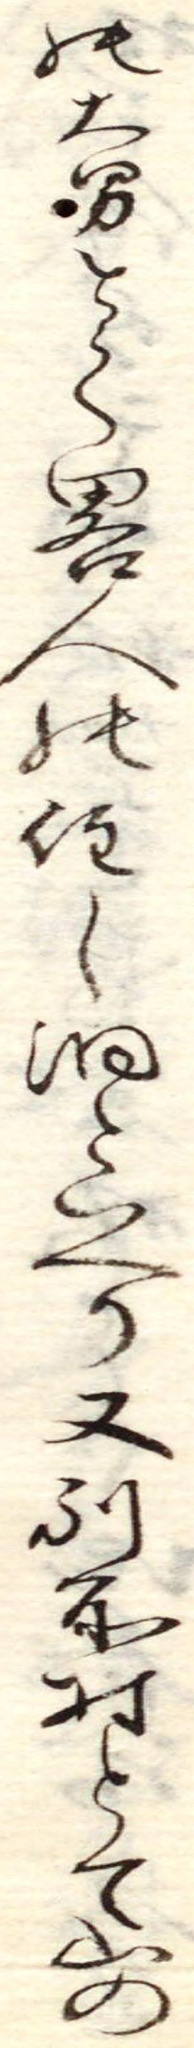の大男とて略人の住し洞といへり又別所村とて山の
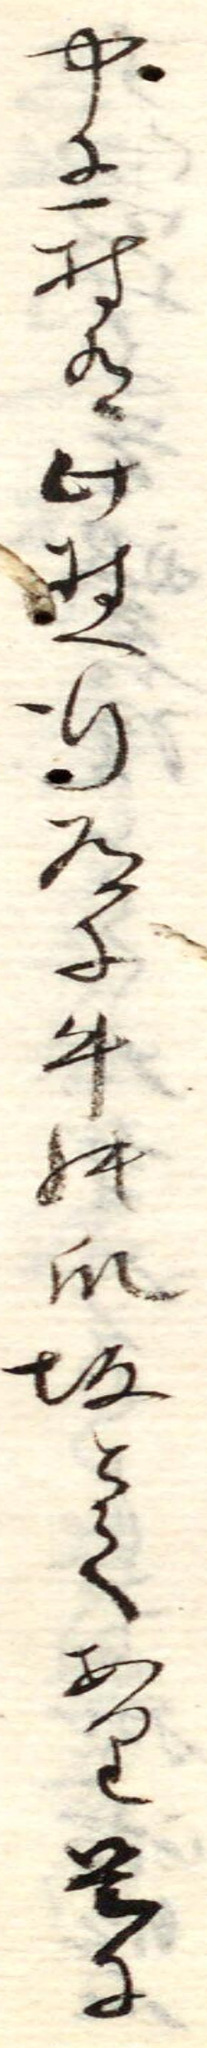中に一村有此村へ行道に牛の爪坂とてあり是に
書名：能登名跡誌
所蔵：Ishikawa Prefectural Library
